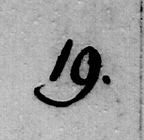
30.
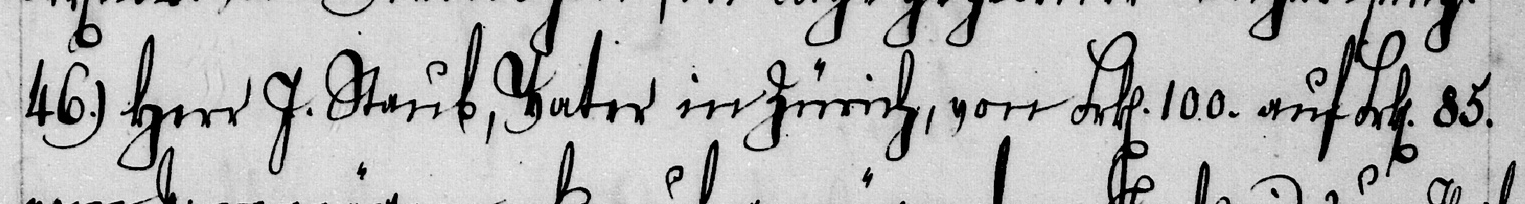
46.) Herr J. Staub, Vater in Zürich, von Frk[en]. 100.
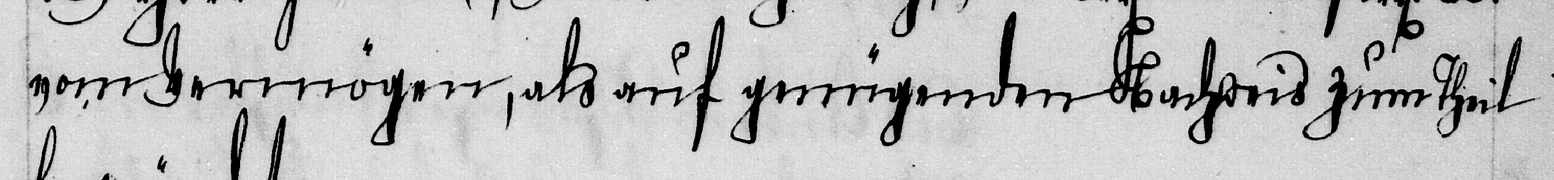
vom Vermögen, als auf genügenden Nachweis zum Theil
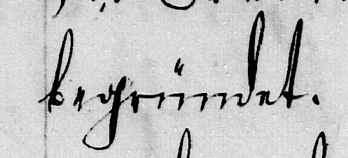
begründet.
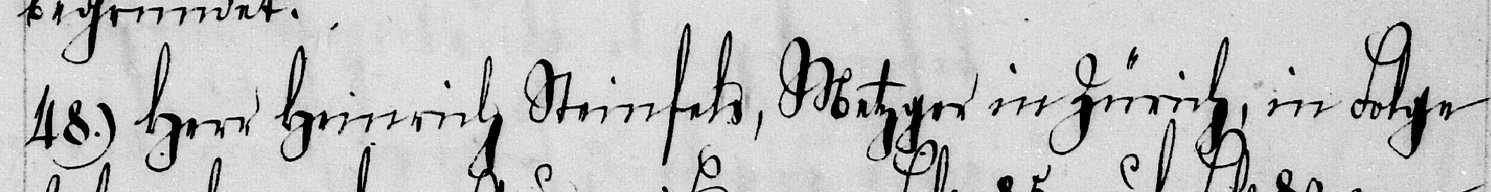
48.) Herr Heinrich Steinfels, Metzger in Zürich, in Folge
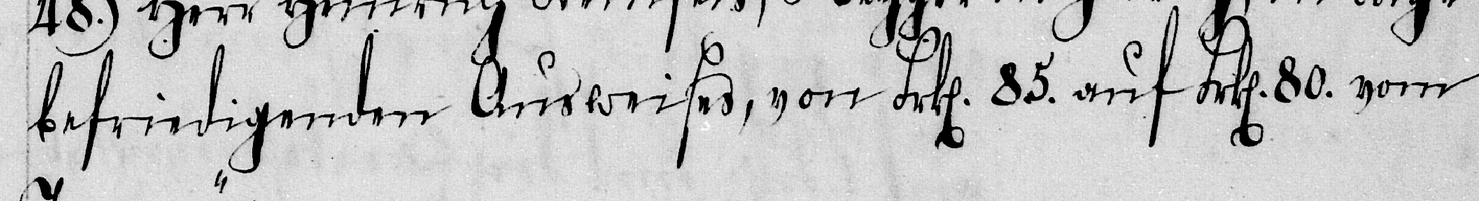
befriedigenden Ausweises, von Frk[en]. 85. auf Frk[en]. 80. vom
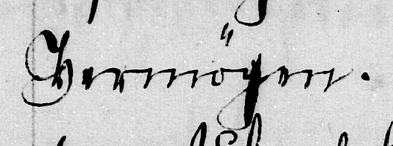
Vermögen.
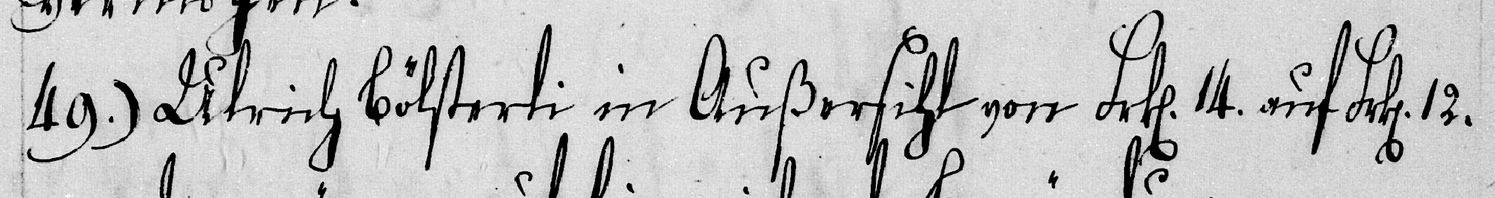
49.) Ulrich Bölsterli in Außersihl von Frk[en]. 14.
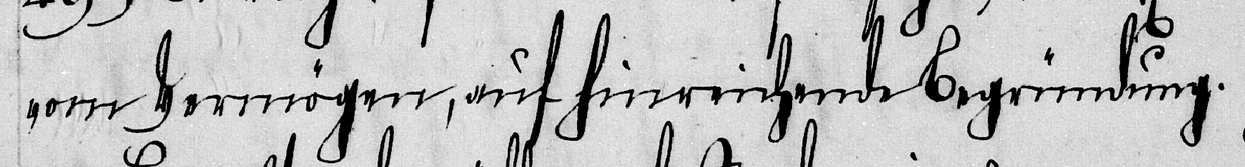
vom Vermögen, auf hinreichende Begründung.
